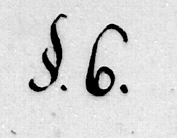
§. 6.
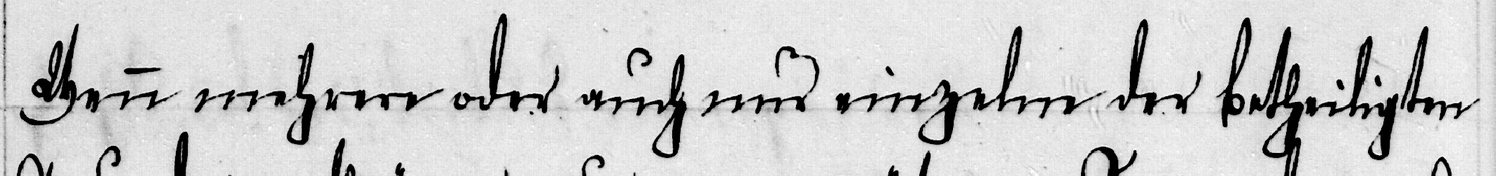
Wenn mehrere oder auch nur einzelne der betheiligten
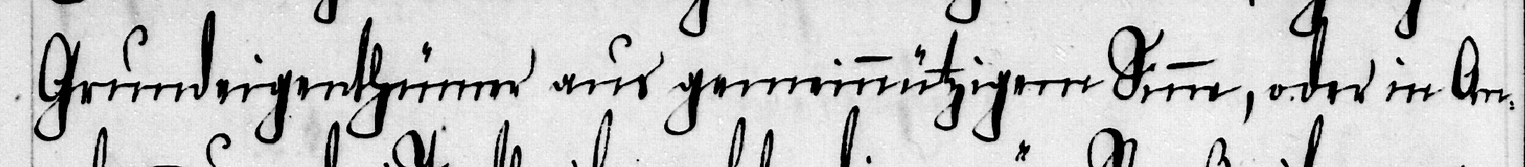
Grundeigenthümer aus gemeinnützigem Sinne, oder in An¬
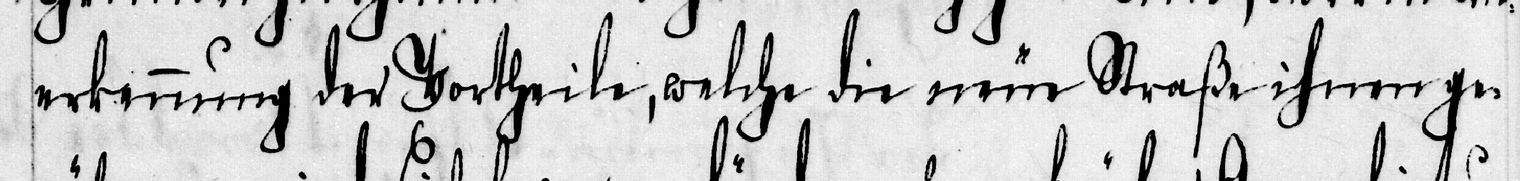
erkennung der Vortheile, welche die neue Straße ihnen ge¬
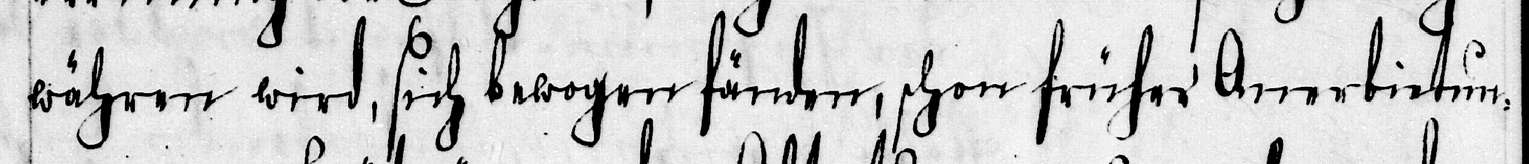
währen wird, sich bewogen fänden, schon früher Anerbietun¬
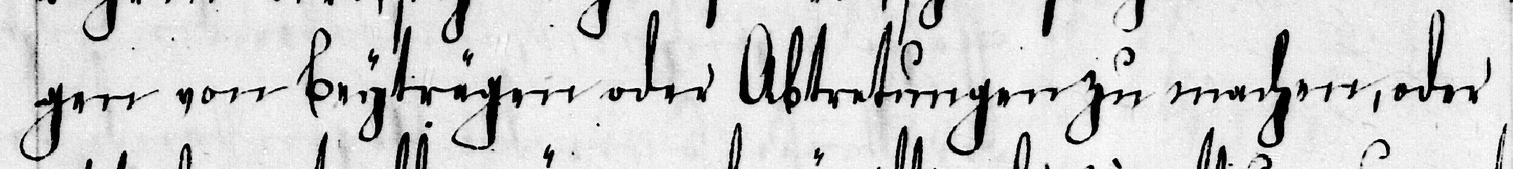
gen von Beyträgen oder Abtretungen zu machen, oder
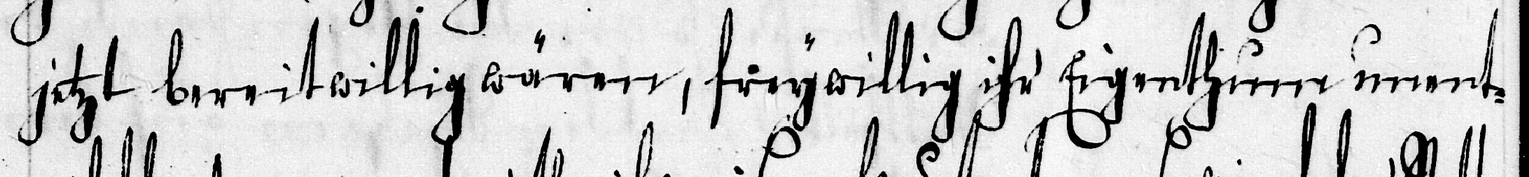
jetzt bereitwillig wären, freywillig ihr Eigenthum unent¬
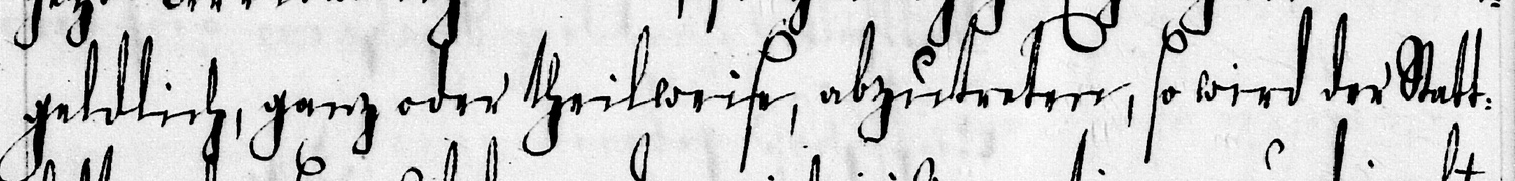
geldlich, ganz oder theilweise, abzutreten, so wird der Stat¬
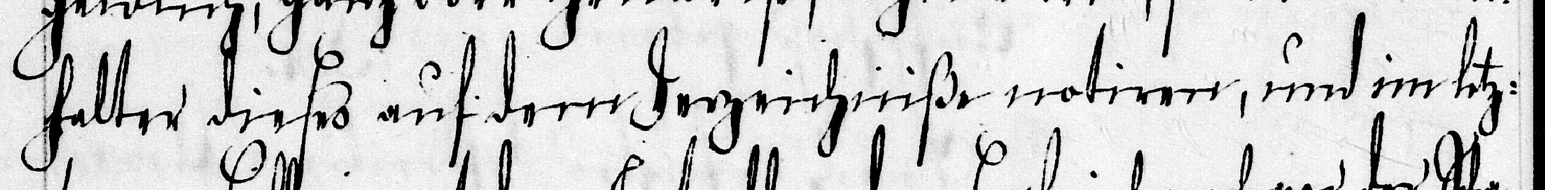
thalter dieses auf dem Verzeichniße notiren, und im letz¬
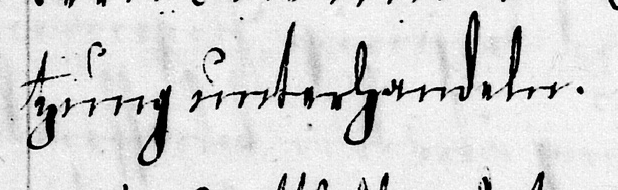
tzung unterhandeln.
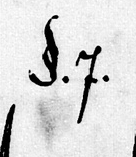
§. 7.
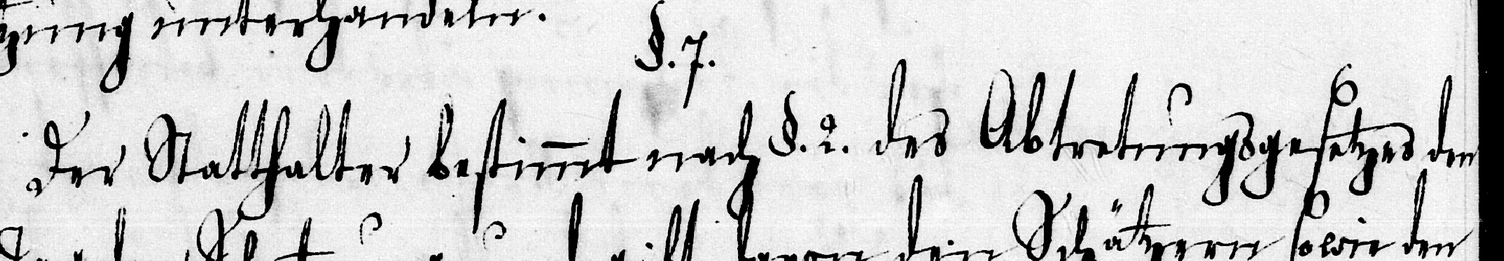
Der Statthalter bestimmt nach §. 2. des Abtretungsgesetzes den
